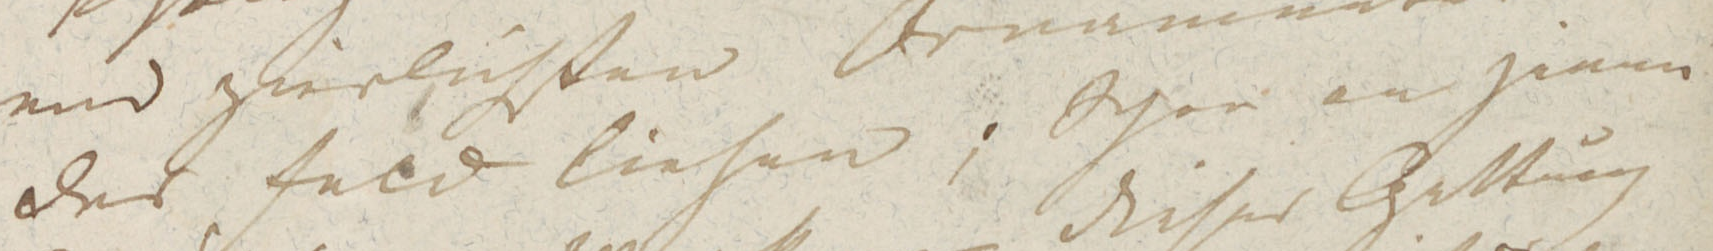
das Feld liehen; Schon an jenen
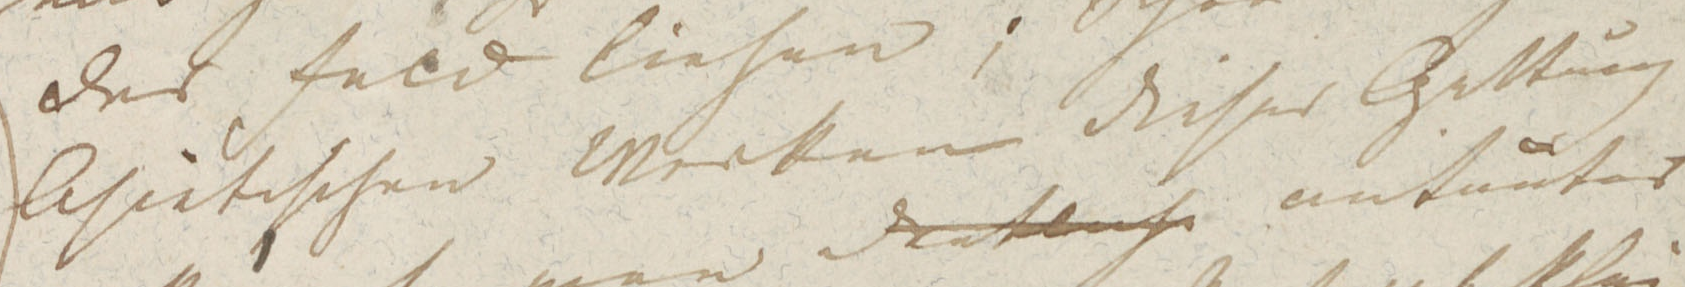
Asiatischen Werken dieser Gattung
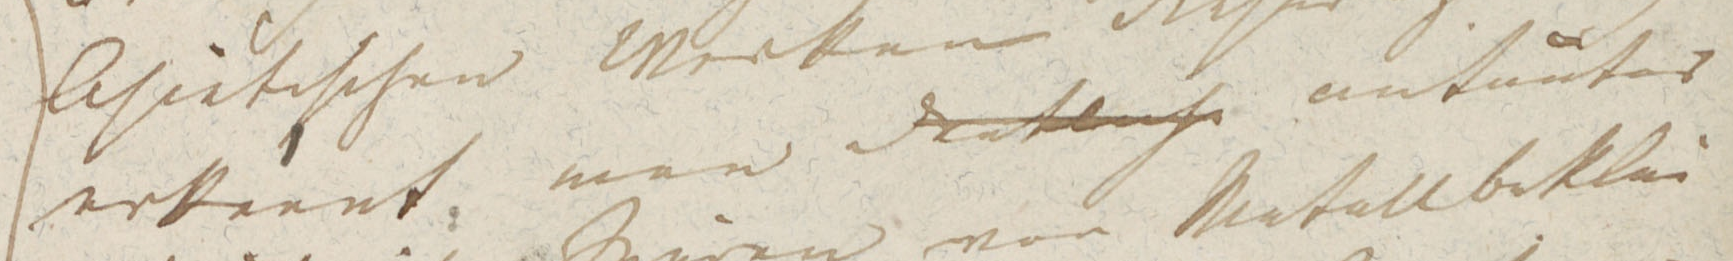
erkennt man deutlich mitunter
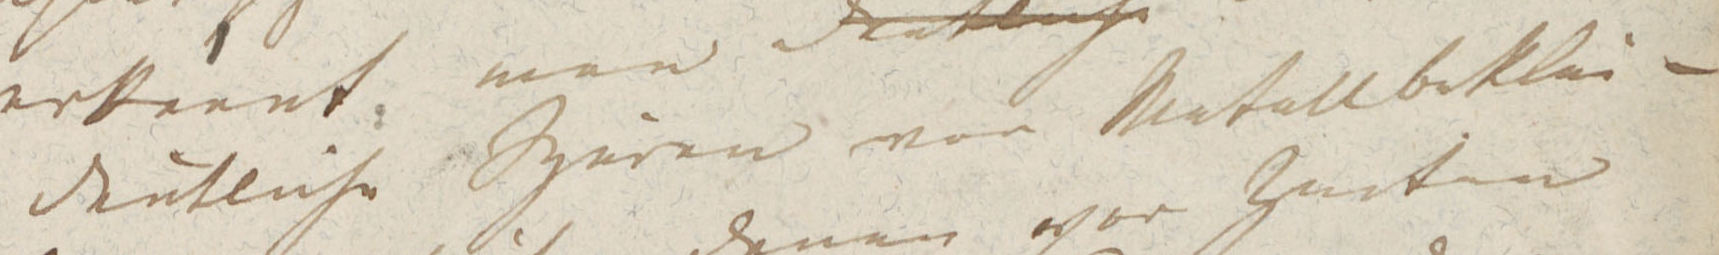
deutliche Spuren von Metallbeklei-
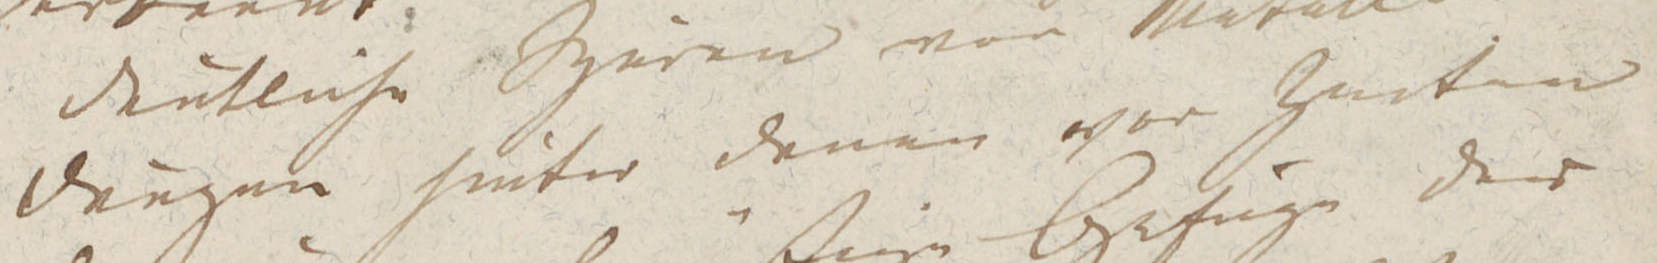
dungen hinter denen vor Zeiten
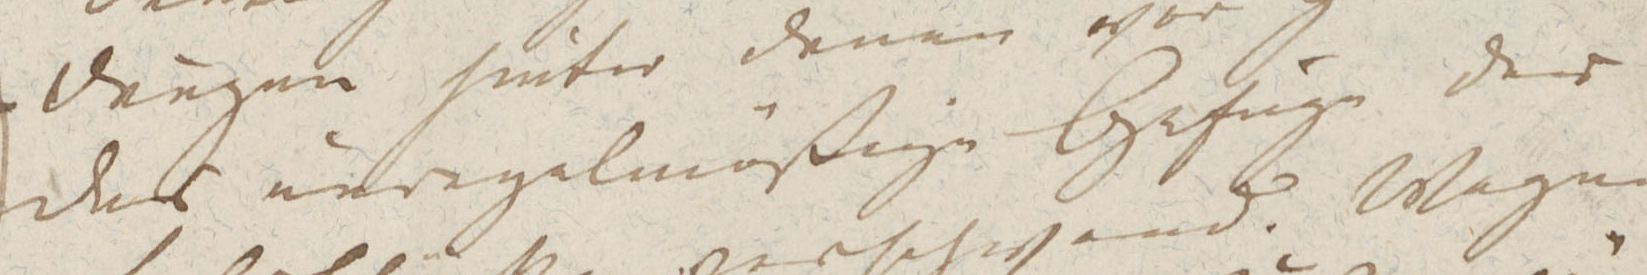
das unregelmässige Gefüge der
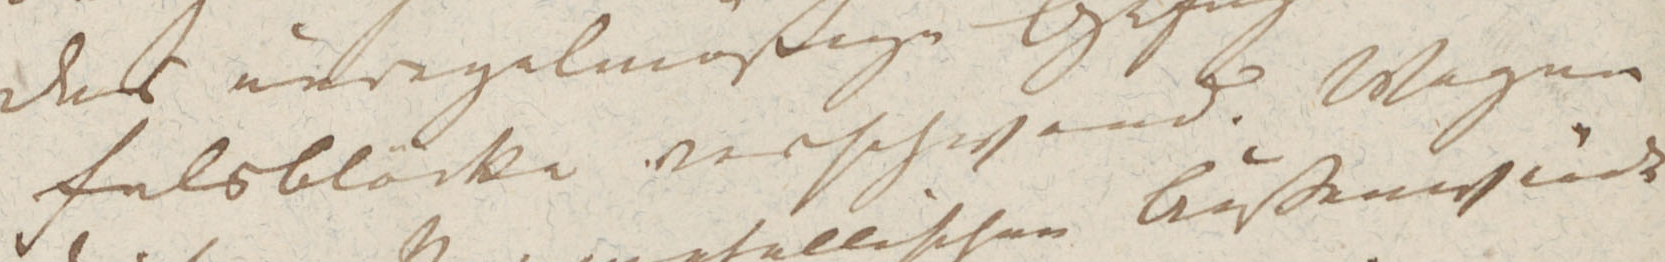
Felsblöcke verschwand. Wegen
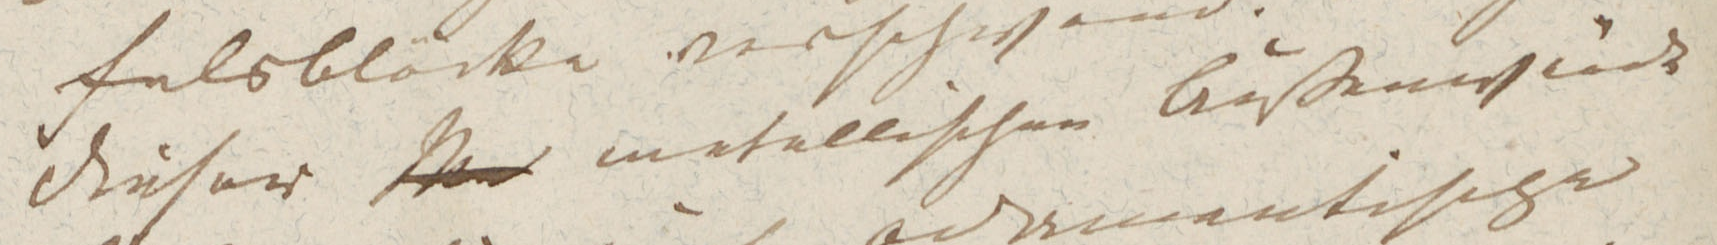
dieser N metallischen Aussenwände
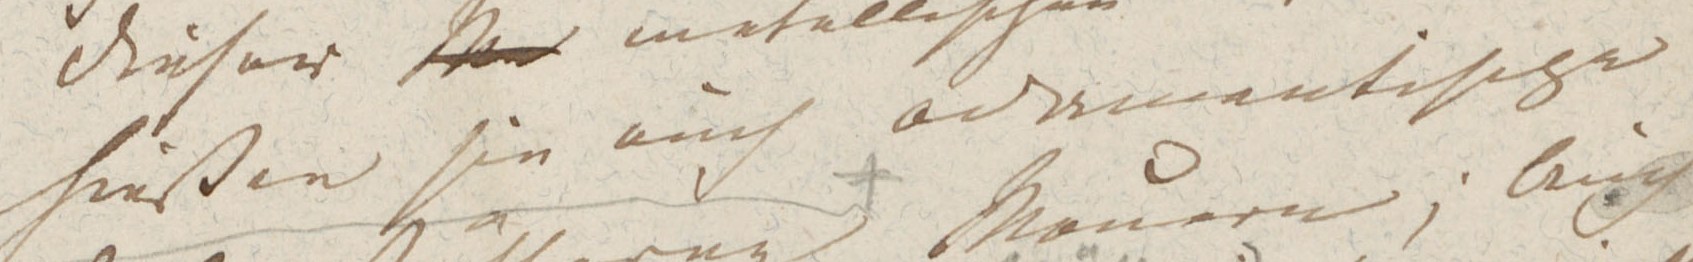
hiessen sie auch adamantische
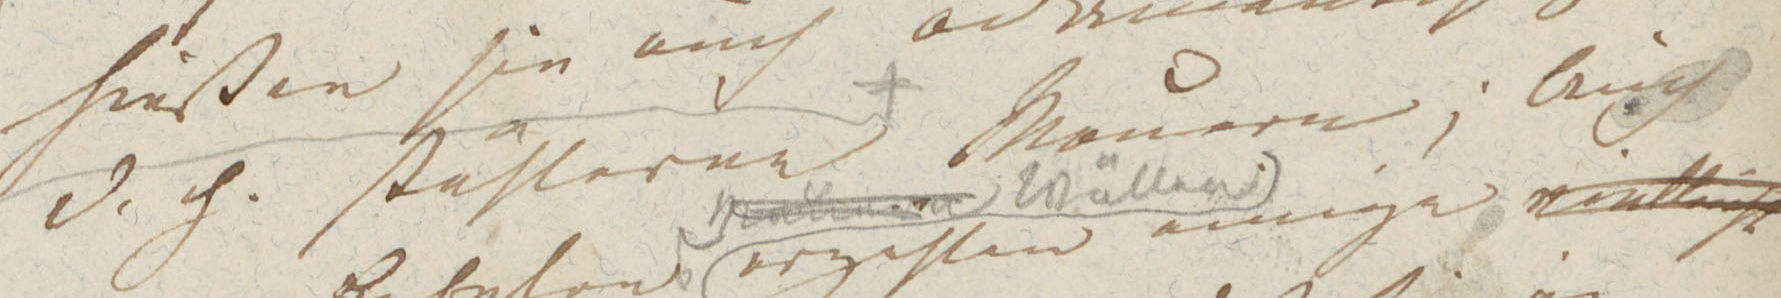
d. h. stählerne % Mauern; Auch
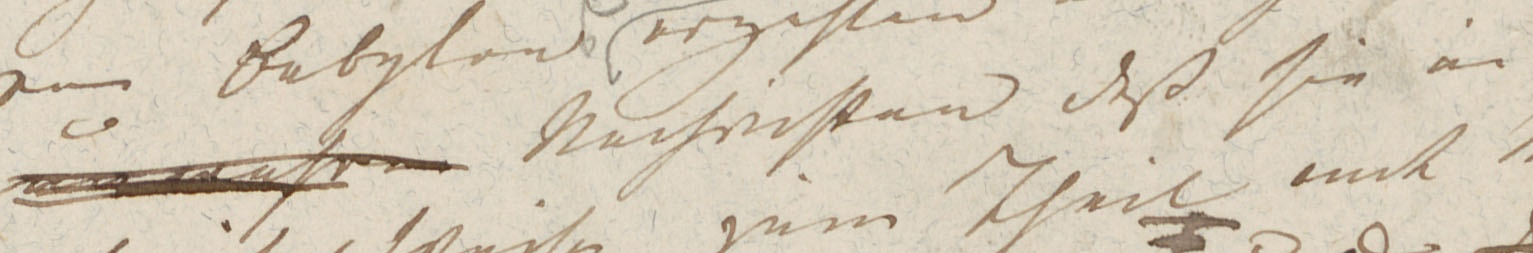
unwahre Nachrichten dass sie in
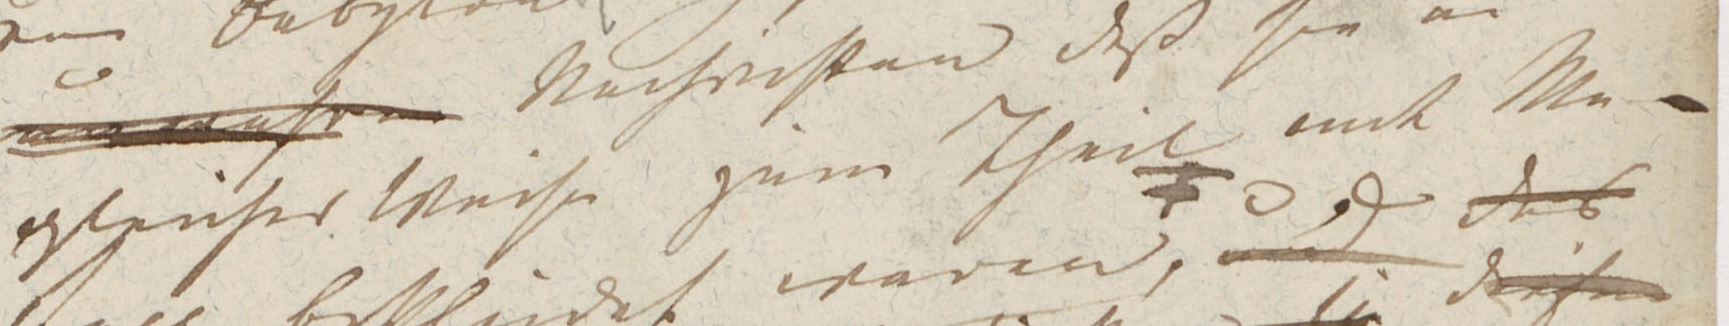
gleicher Weise zum Theil mit Me-
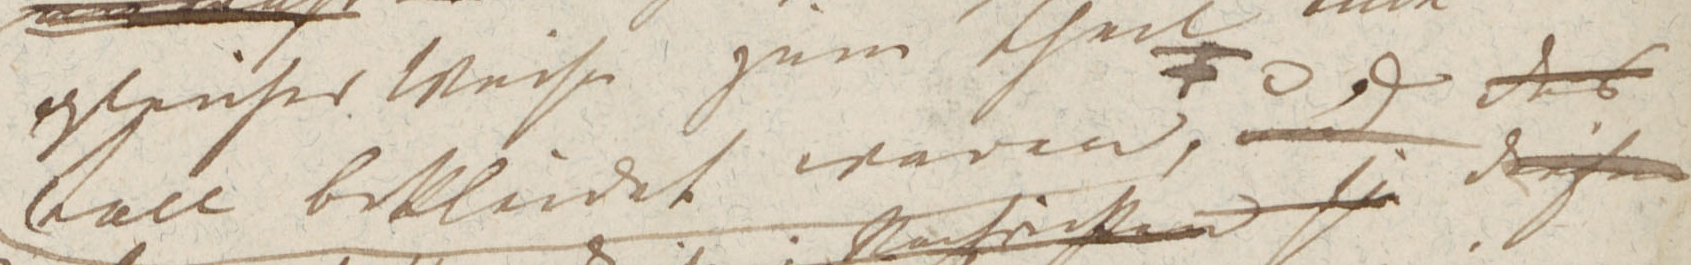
tall bekleidet waren, % und das
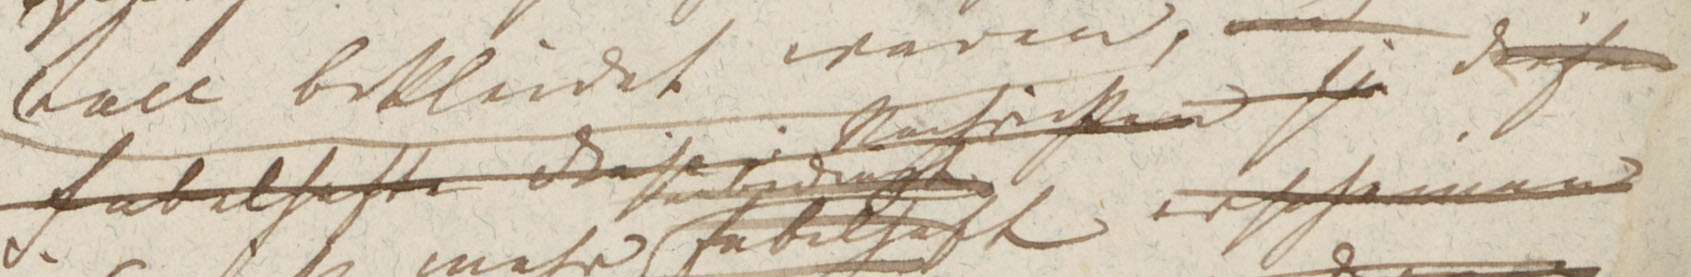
fabelhafte dieser Nachrichten sie dürfen
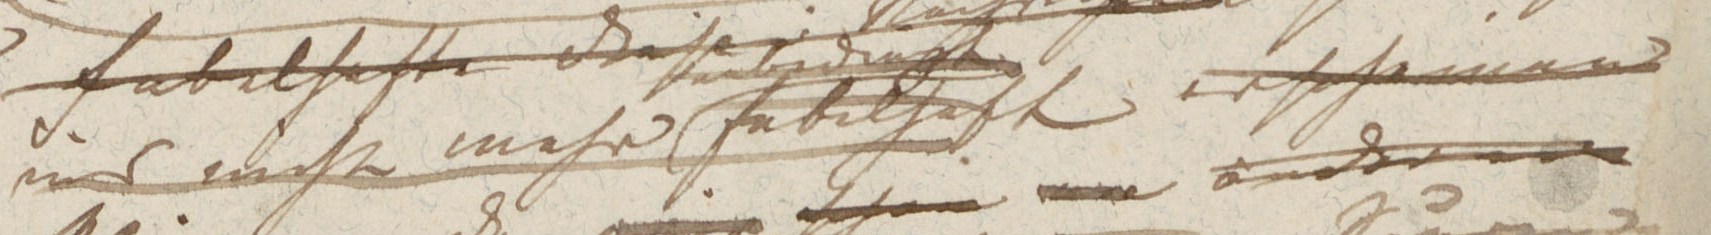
uns nicht mehr unbedingt fabelhaft erscheinen
